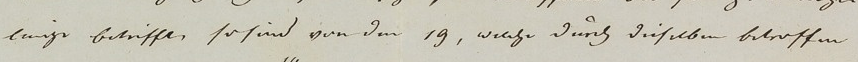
linge betrifft, so sind von den 19, welche durch dieselben betroffen
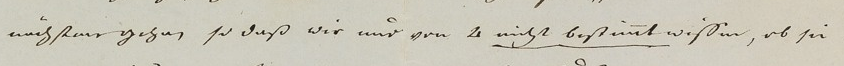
nächstens gehn, so daß wir nur von 4 nicht bestimmt wissen, ob sie
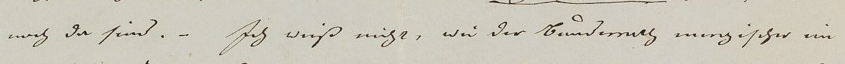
noch da sind. – Ich weiß nicht, wie der Bundesrath energischer ein-
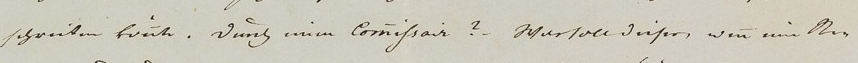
schreiten könnte. Durch einen Commissair? – Was soll dieser, wenn eine Re-
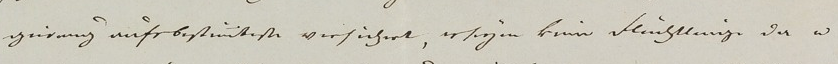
gierung aufs bestimmteste versichert, es seyen keine Flüchtlinge da u
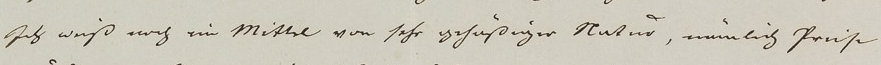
Ich weiß noch ein Mittel von sehr gehäßiger Natur, nämlich Preise
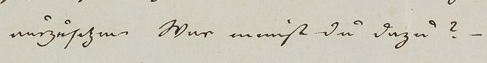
auszusetzen. Was meinst Du dazu?
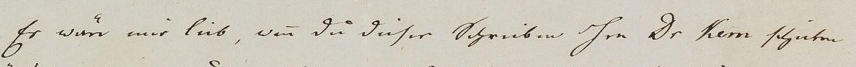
Es wäre mir lieb, wenn Du dieses Schreiben Hrn Dr Kern schicken
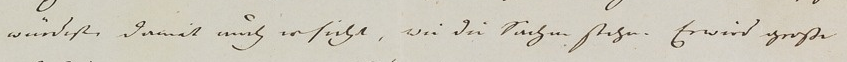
würdest, damit auch er sieht, wie die Sachen stehn. Er wird große
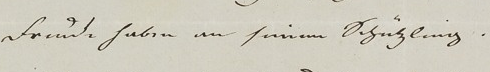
Freude haben an seinem Schützling.
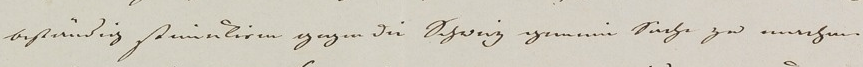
beständig stimuliren gegen die Schweiz gemeine Sache zu machen.
